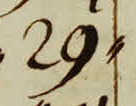29
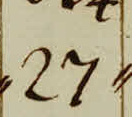27
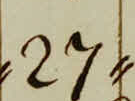27
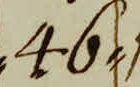46
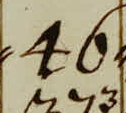46
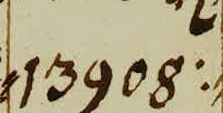13908
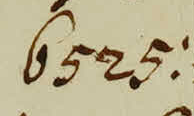6525
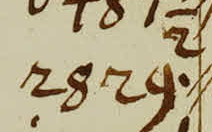2829
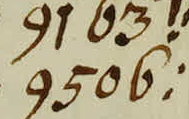9506
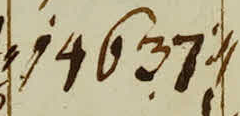14637
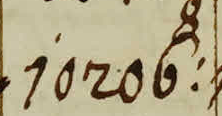10206
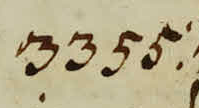3355
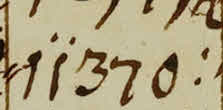11370
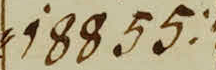18855
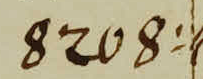8208
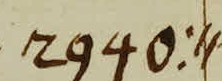2940:
